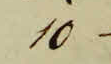10
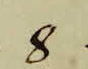8
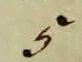5
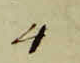4
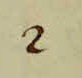2
